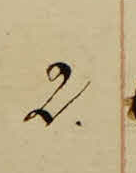2.
